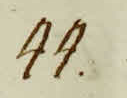44.
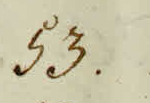53.
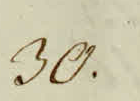30.
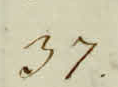37
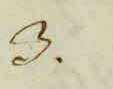3.
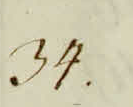34.
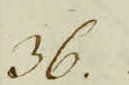36.
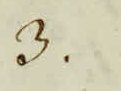3.
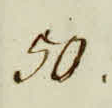50
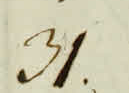31.
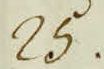25
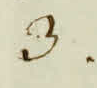3
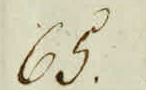65.
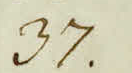37.
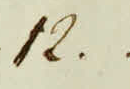12.
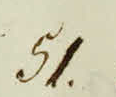51.
